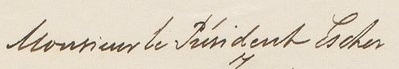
Monsieur le Président Escher
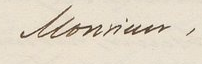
Monsieur,
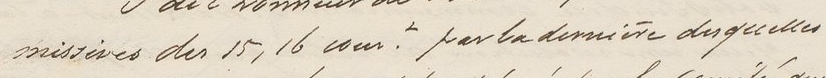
missives des 15, 16 court par la dernière desquelles
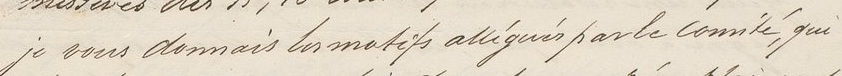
je vous donnais les motifs allégués par le Comité, qui
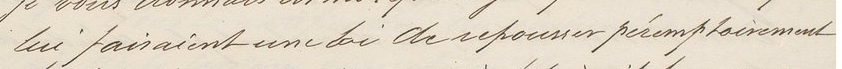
lui faisaient une loi de repousser péremptoirement
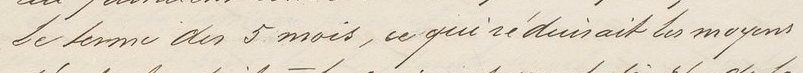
le terme des 5 mois, ce qui réduisait les moyens
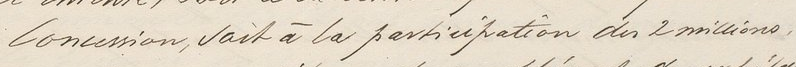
Concession, soit à la participation des 2 millions,
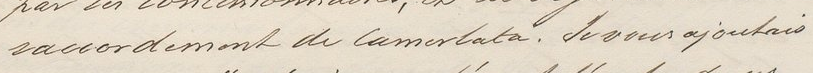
raccordement de Camerlata. Je vous ajoutais
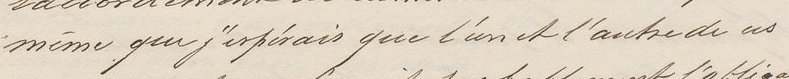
même que j'espérais que l'un et l'autre de ces
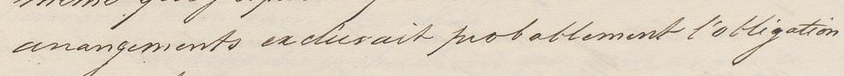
arrangements exclusait probablement l'obligation
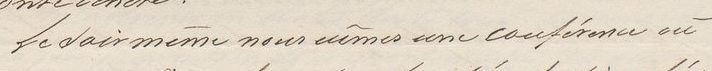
Le soir même nous eûmes une conférence où
